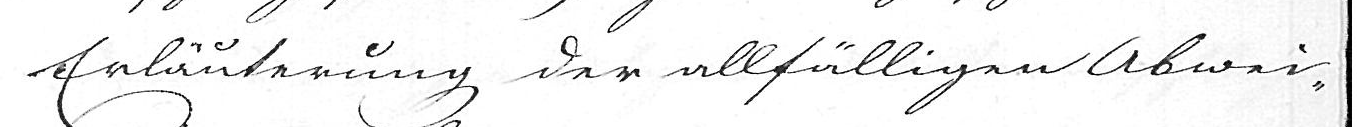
Erläuterung der allfälligen Abwei-
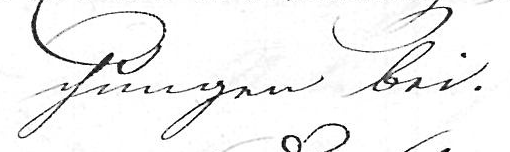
chungen bei.
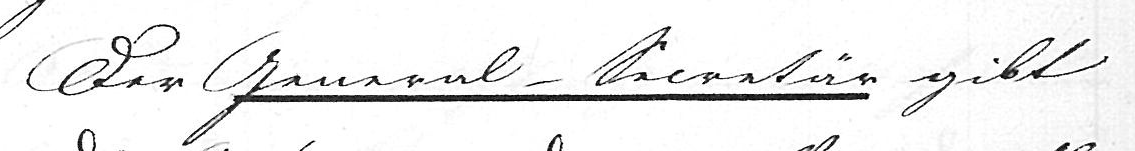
Der General-Secretär gibt
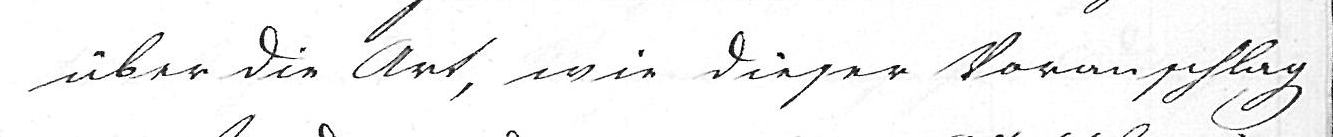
über die Art, wie dieser Voranschlag
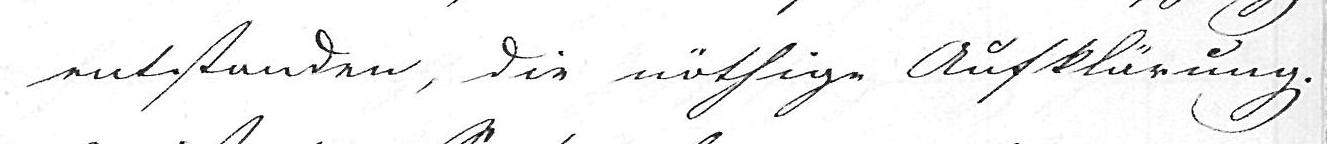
entstanden, die nöthige Aufklärung.
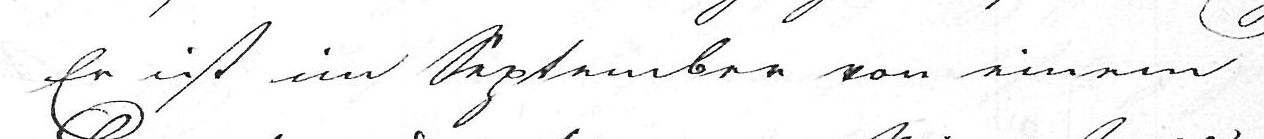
Er ist im Sertember von einem
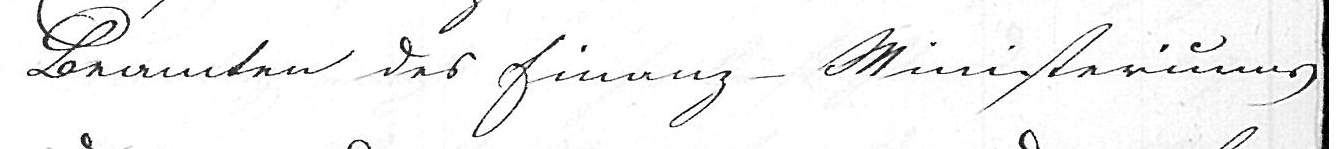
Beamten des Finanz-Ministeriums
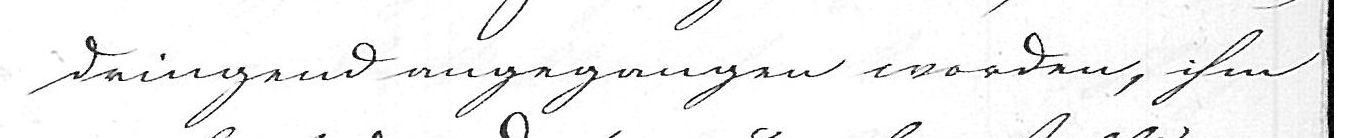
dringend angegangen worden, ihm
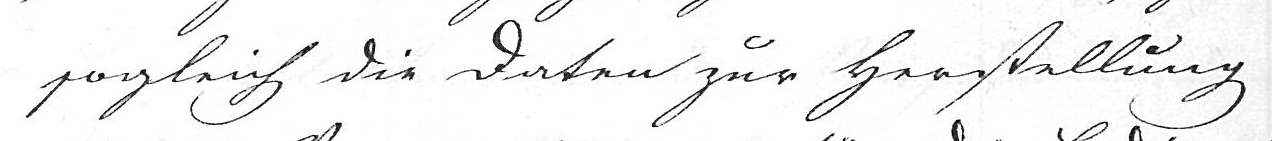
sogleich die Daten zur Herstellung
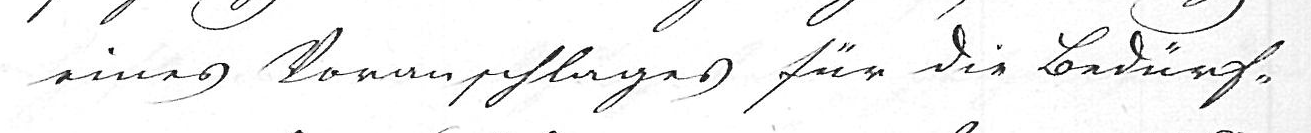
eines Voranschlage für die Bedürf-
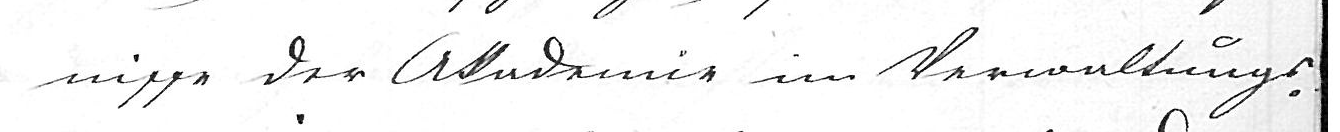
nisse der Akademie im Verwaltungs-
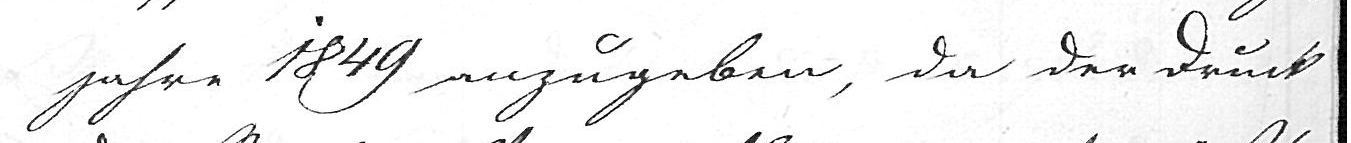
jahre 1849 anzugeben, da der Druck
